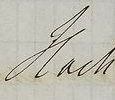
Herr
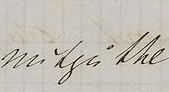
Wie ich Ihnen
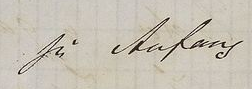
zu Anfang
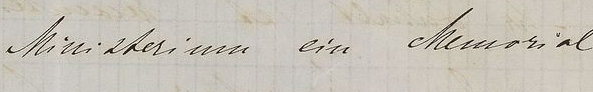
Ministerium ein Memorial
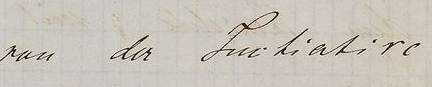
von der Initiative
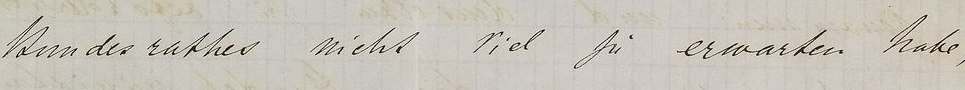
Bundesrathes nicht viel zu erwarten habe,
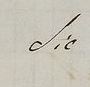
dass
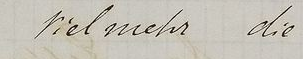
sie vielmehr die
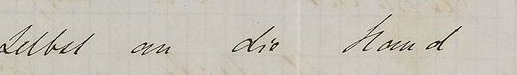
selbst an die Hand
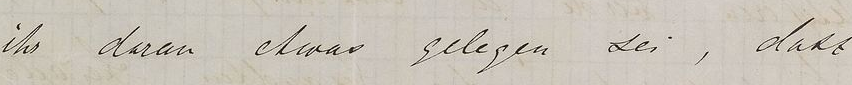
ihr daran etwas gelegen sei, dass
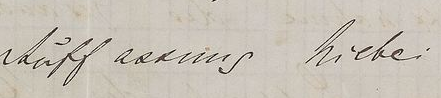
Auffassung hiebei
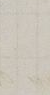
in
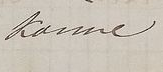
kommen
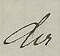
etc.
